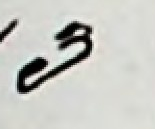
3
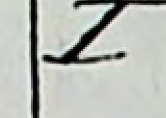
I
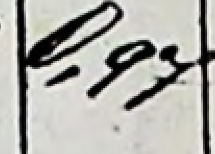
0,97
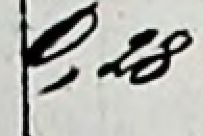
0,28
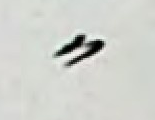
„
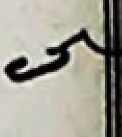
5
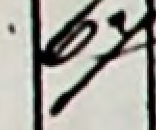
67
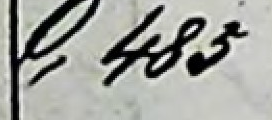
0,485
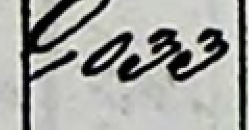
0,033
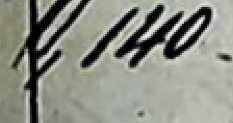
0,140
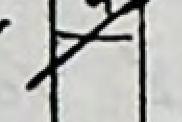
7
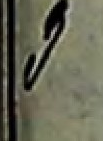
3
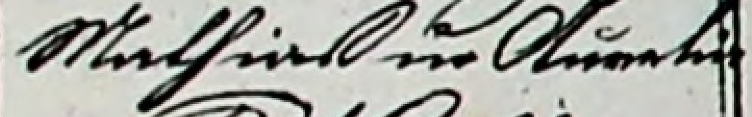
Mathias u Auretin
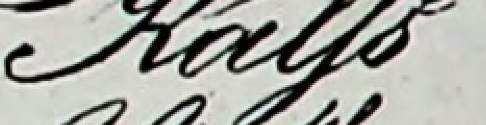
Kalss
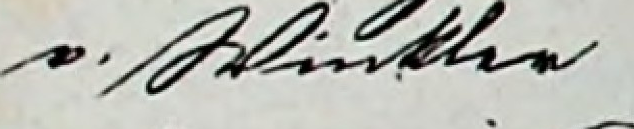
v. Winkler
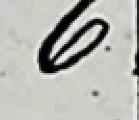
6
